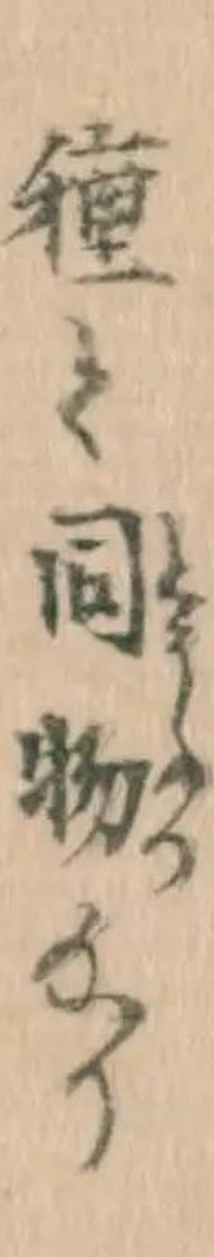種と同物なり

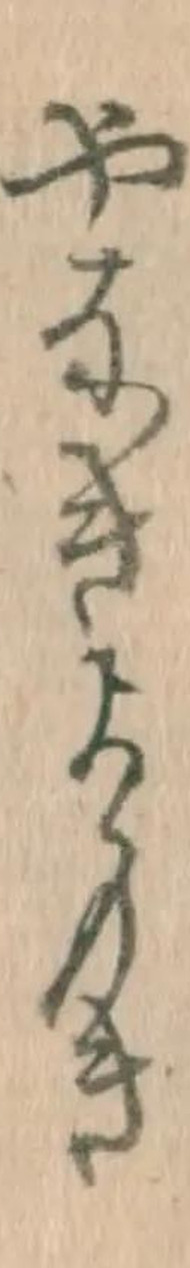やなきよもき
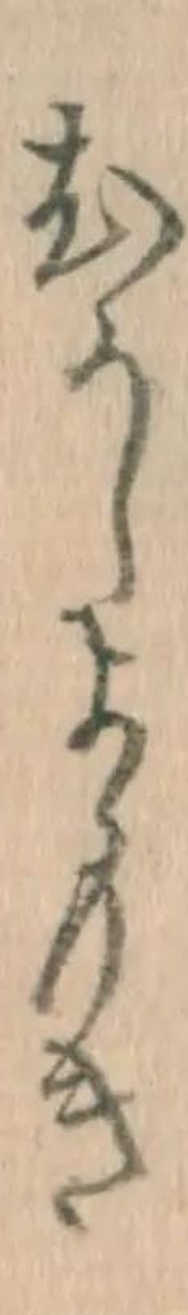むかしよもき
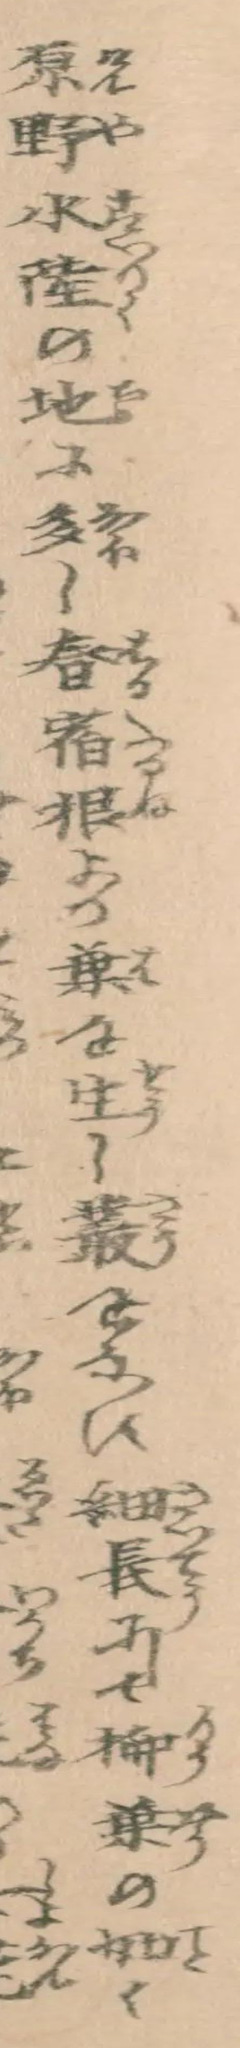原野水陸の地に多し春宿根より葉を生し叢をなす細長にして柳葉の如く
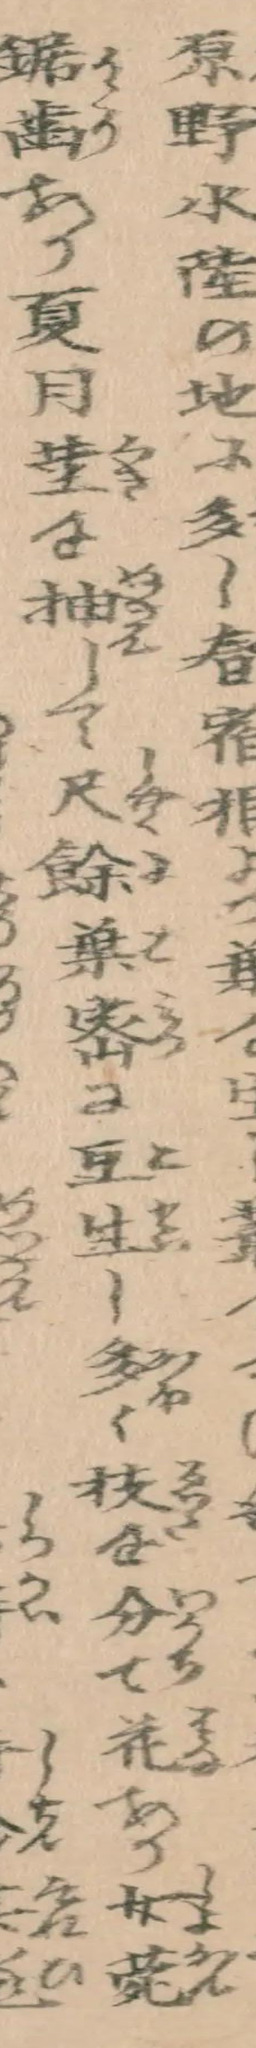鋸歯あり夏月茎を抽して尺余葉密に互生し多く枝を分て花あり女菀

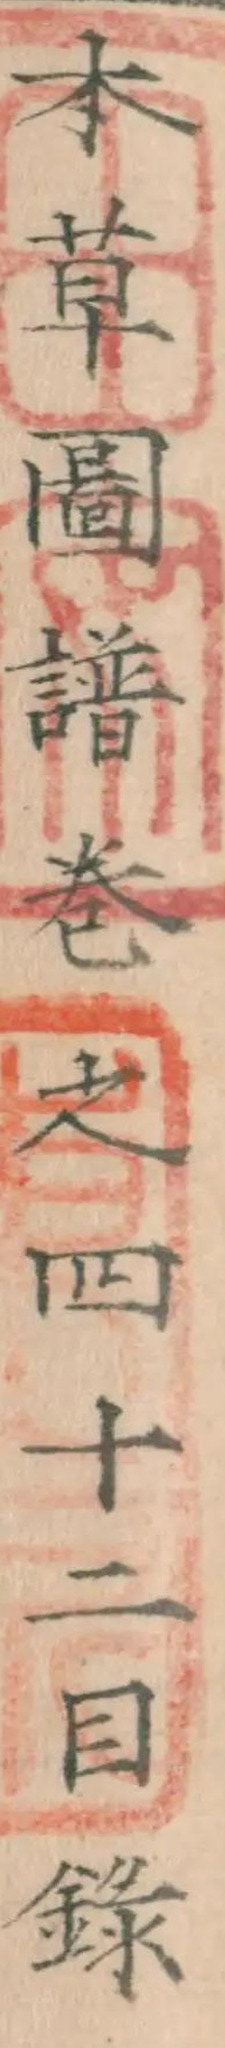本草図譜巻之四十二目録

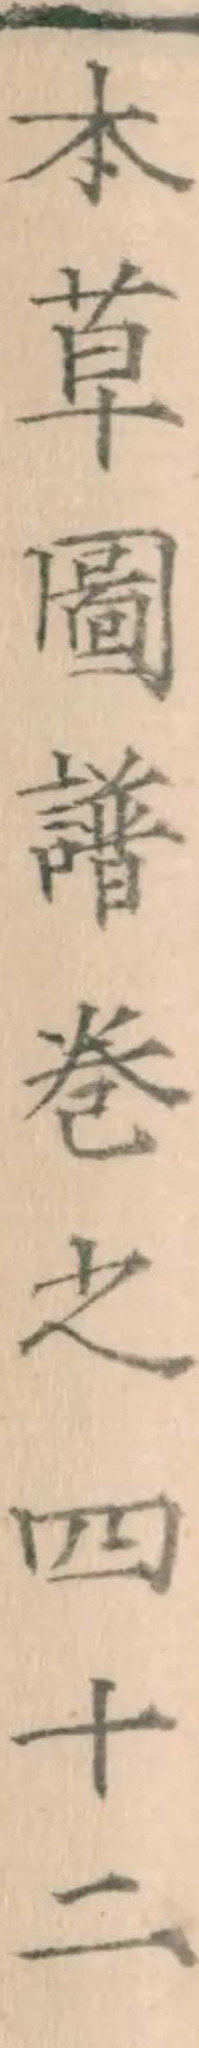本草図譜巻之四十二
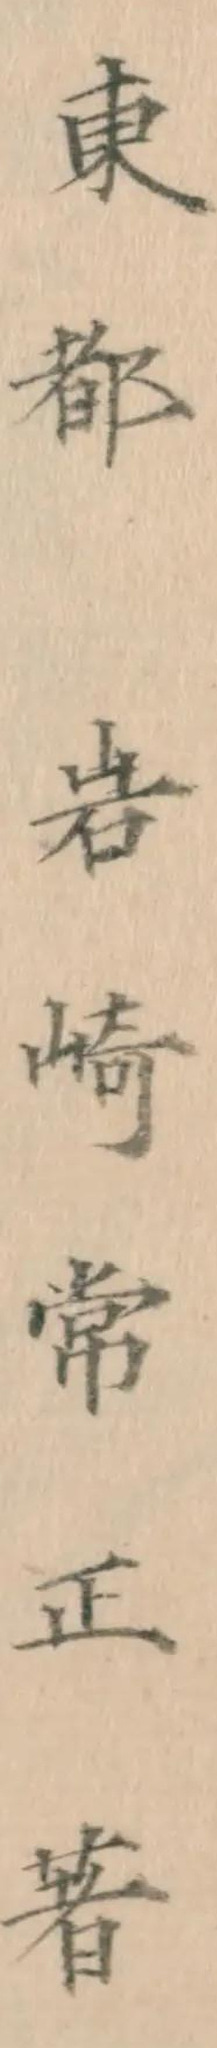東都岩崎常正著

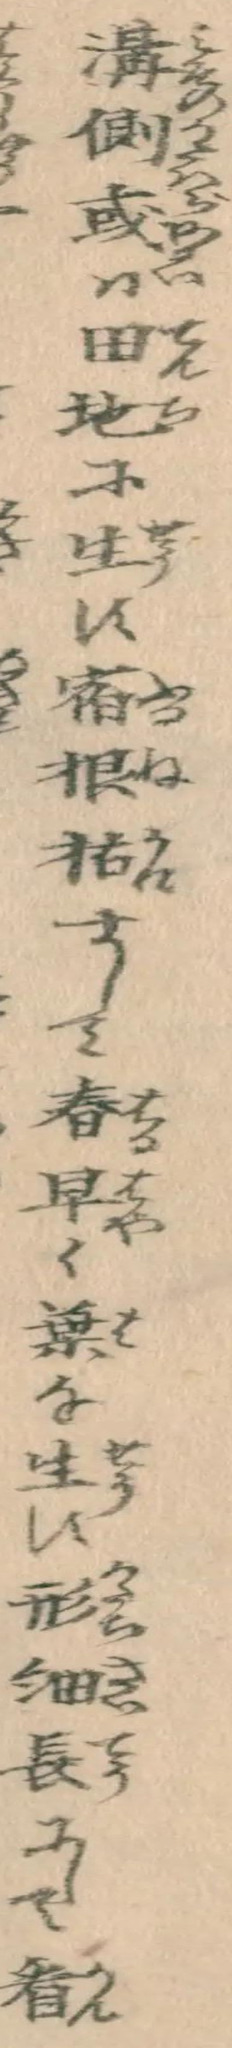溝側或は田地に生す宿根枯すして春早く葉を生す形細長にして看
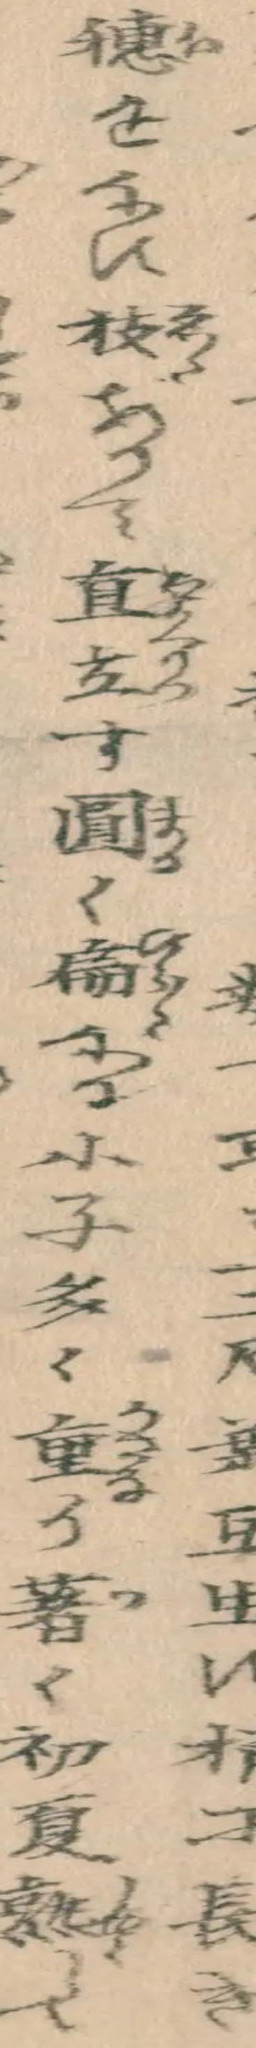穂をなす枝ありて直立す円く扁なる小子多く重り著く初夏熟して
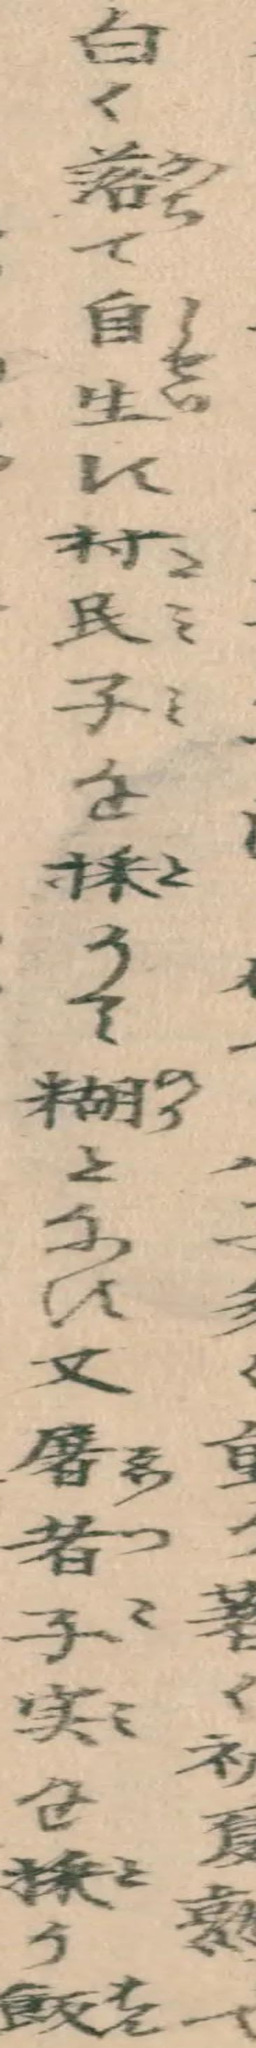白く落て自生す村民子を採りて糊となす又屠者子実を採り飯
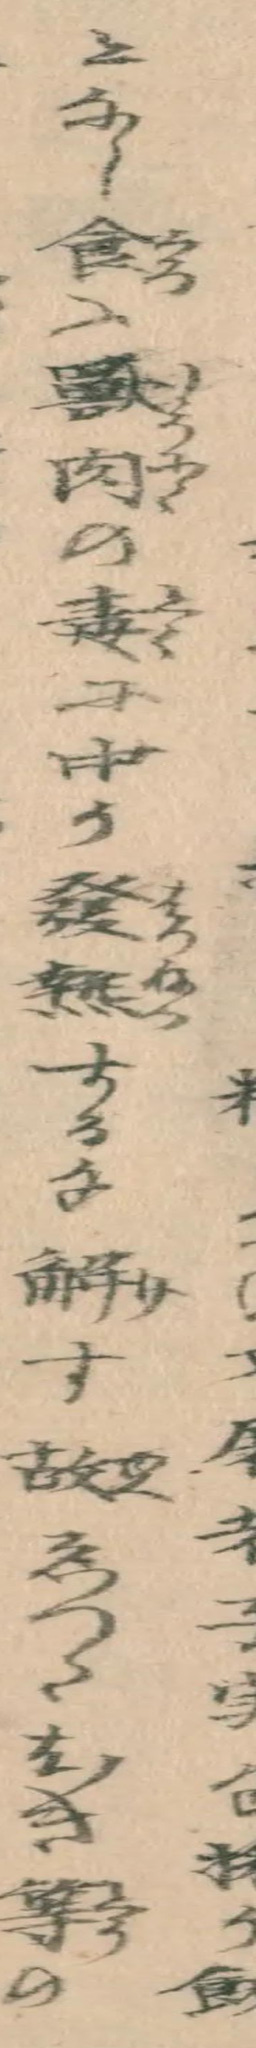となし食ふ獣肉の毒に中り発熱するを解す故ゑつたむき等の

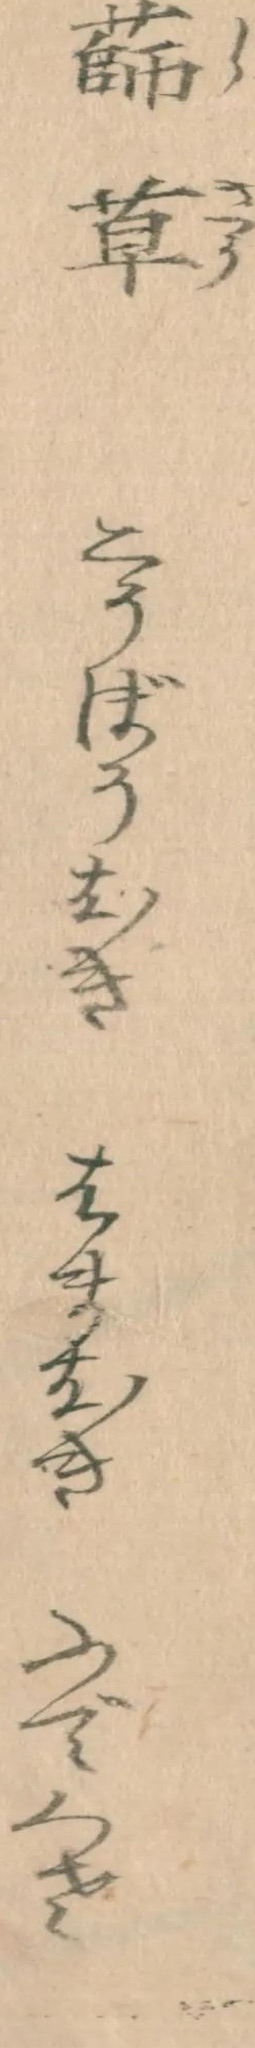蒒草こうぼうむきはまむきふでくさ
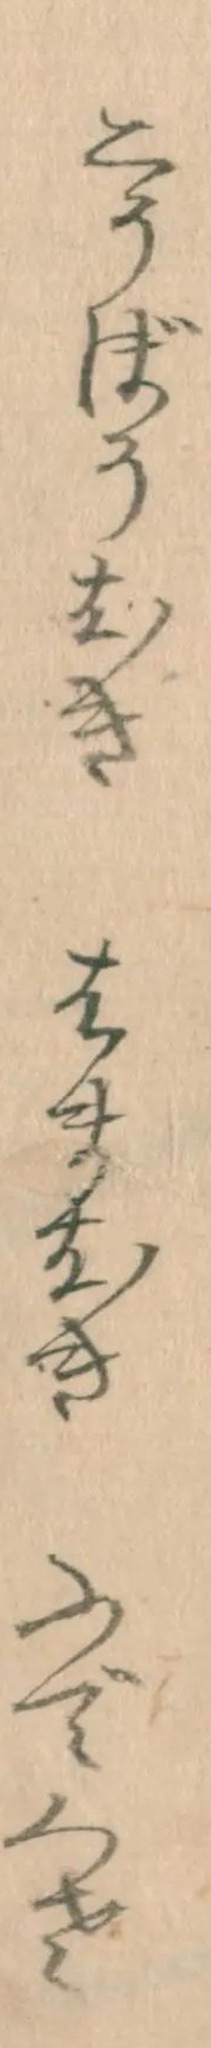蒒草こうぼうむきはまむきふでくさ
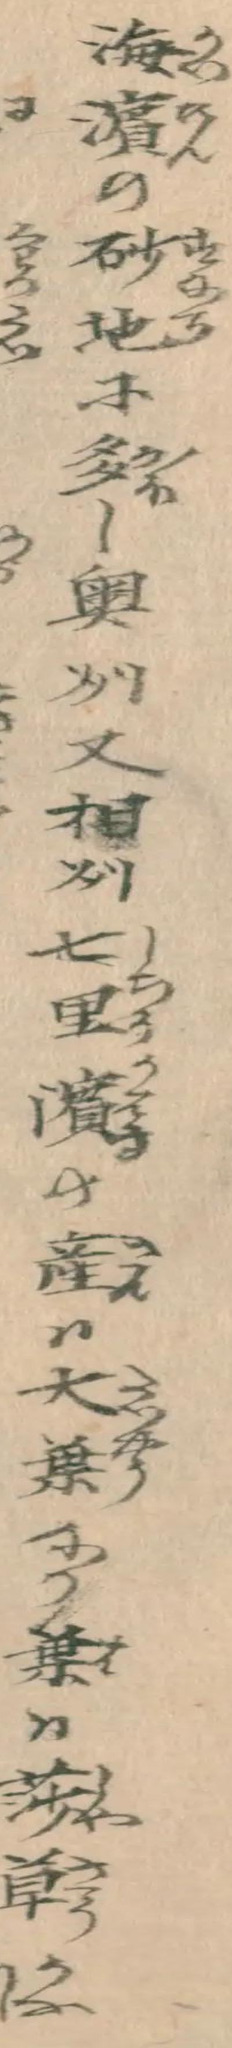海浜の砂地に多し奥州又相州七里浜の産は大葉なり葉は莎草かふふし
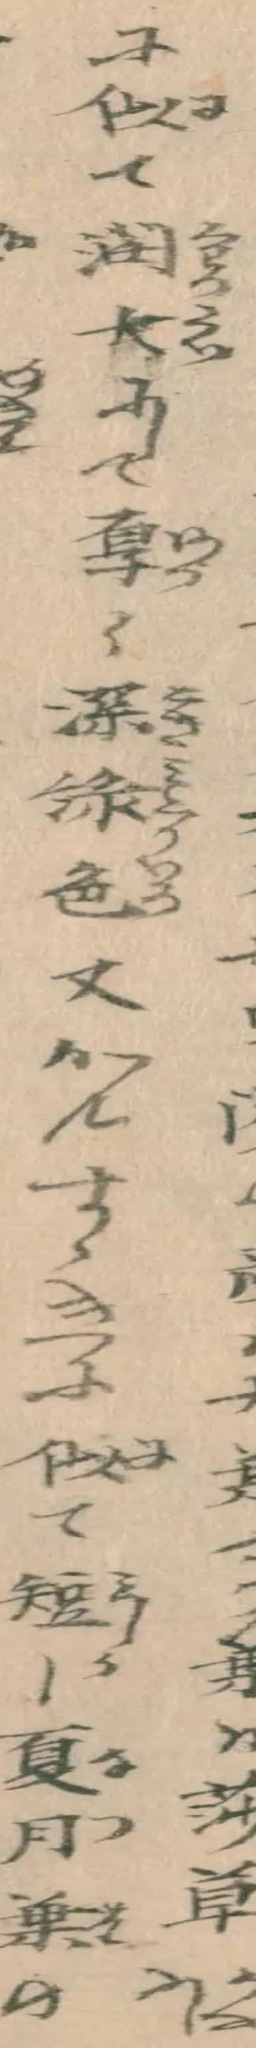に似て闊大にして厚く深緑色又かんすゝきに似て短し夏月葉の
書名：本草図譜. 巻40-42
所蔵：国立国会図書館 National Diet Library, JAPAN
